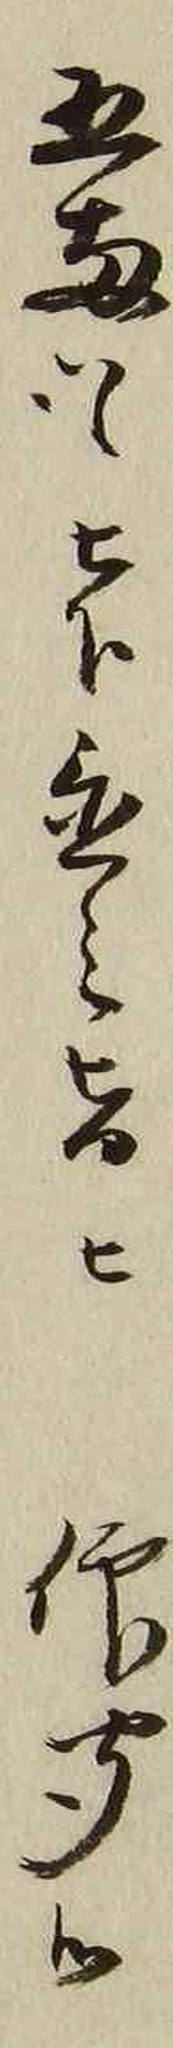五両ツヽ被下置之旨被仰聞候
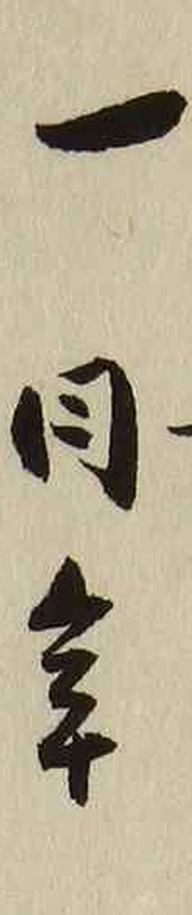一同年
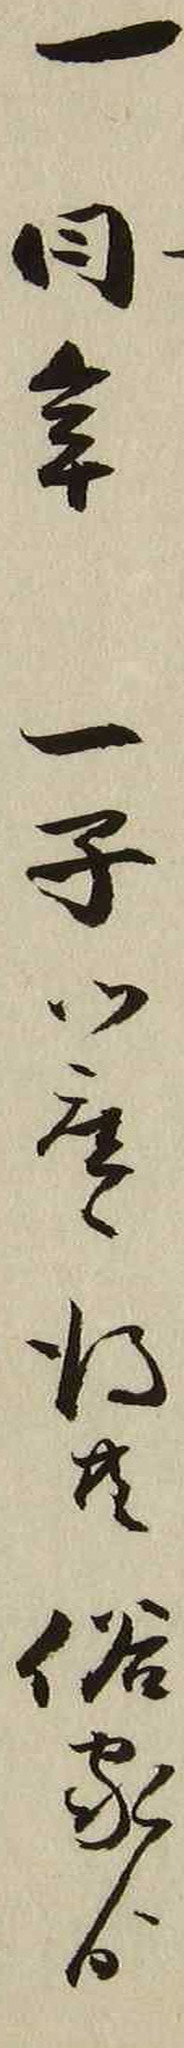一同年一子御座候得共俗家ゟ
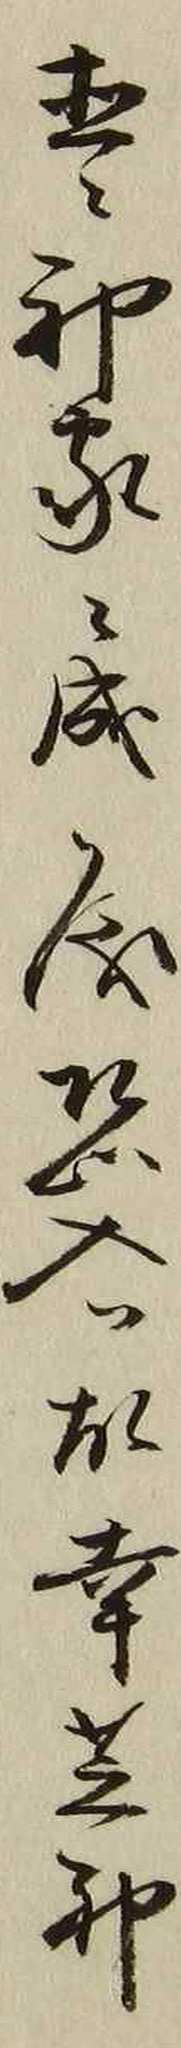直ニ神家ニ成候儀恐入候故幸芝神
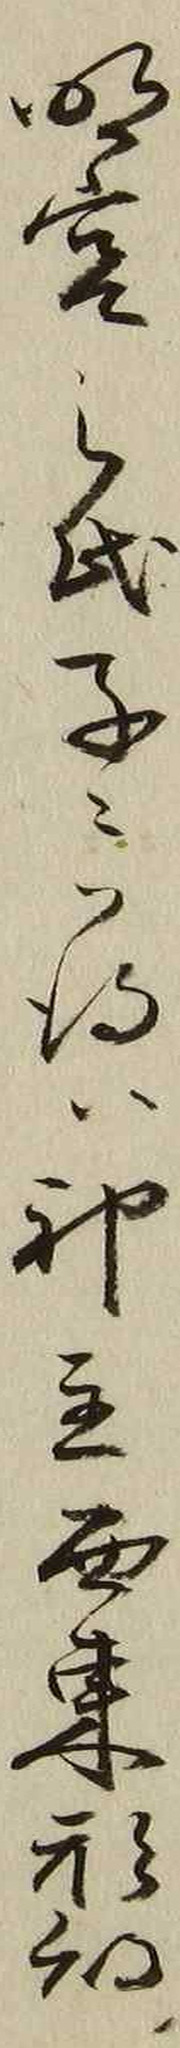明宮之氏子ニ候得ハ神主西東形部
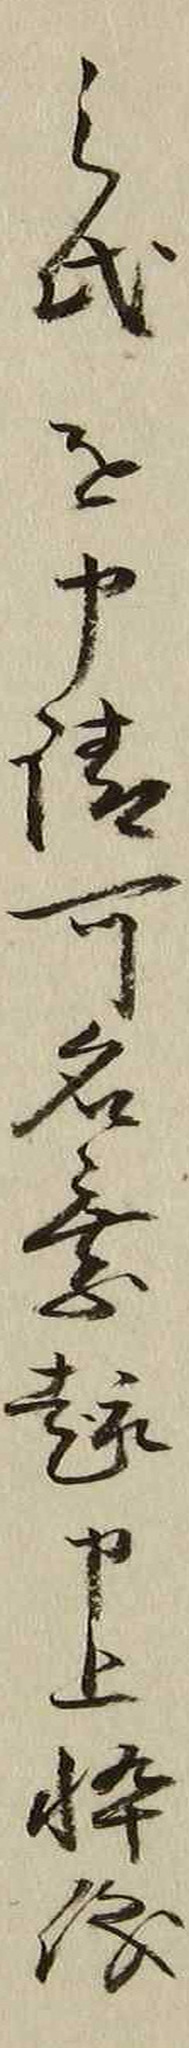之氏を申請可名乗趣申上忰儀
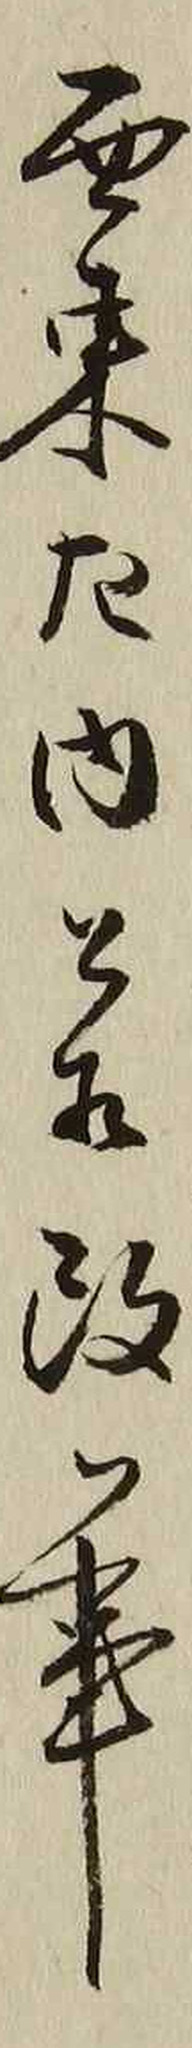西東左内と相改候事
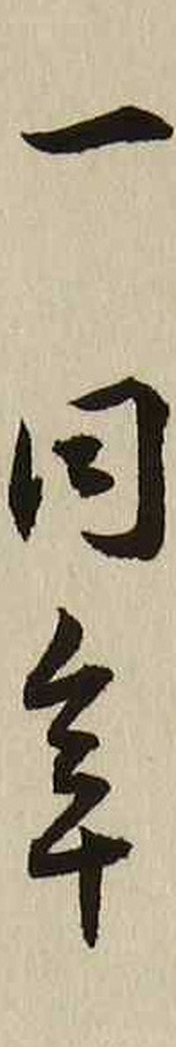一同年
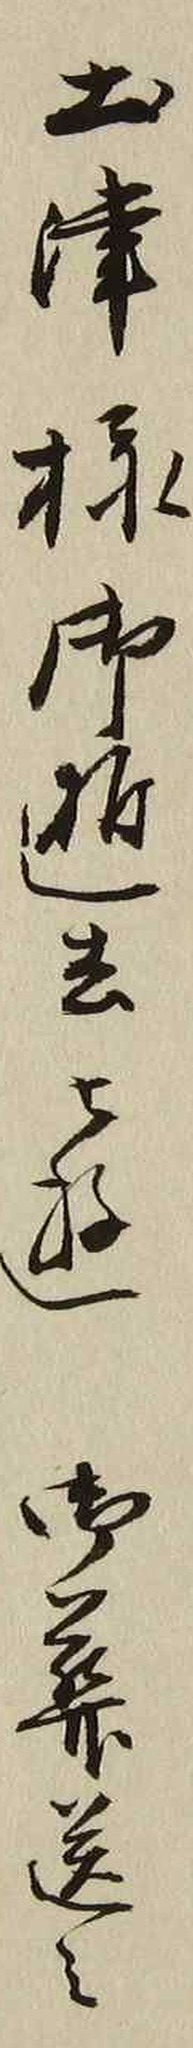土津様御逝去被遊御葬送之
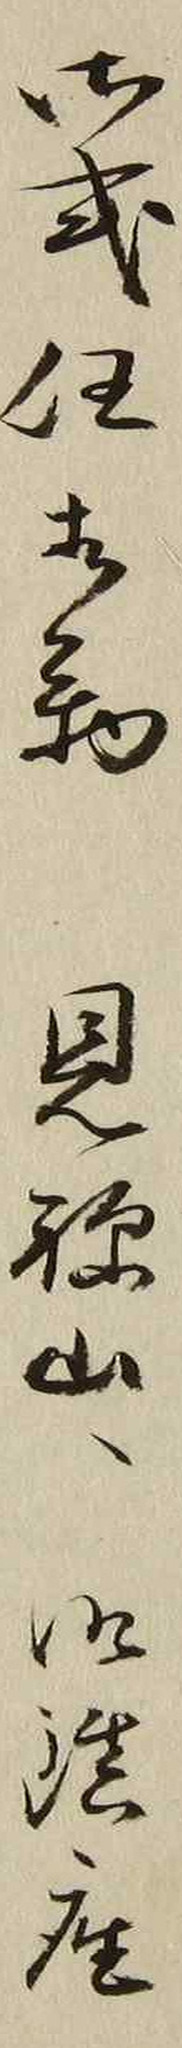御式任相勤見弥山へ御鎮座
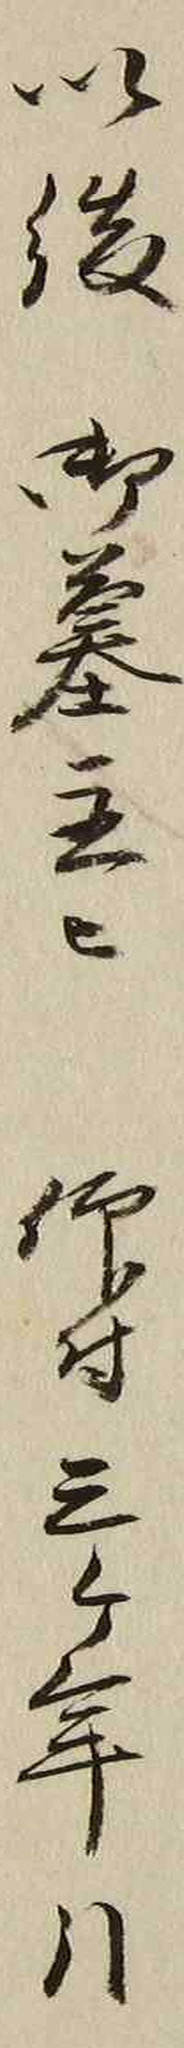以後御墓主被仰付三ヶ年引
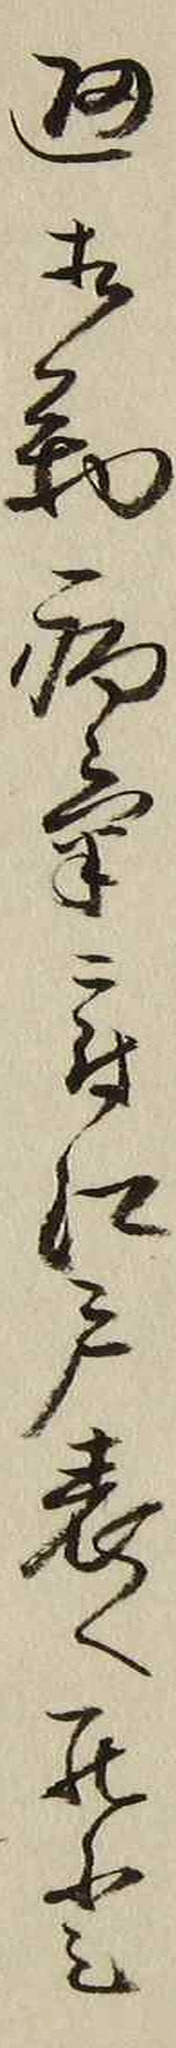通相勤病気ニ付江戸表へ罷登
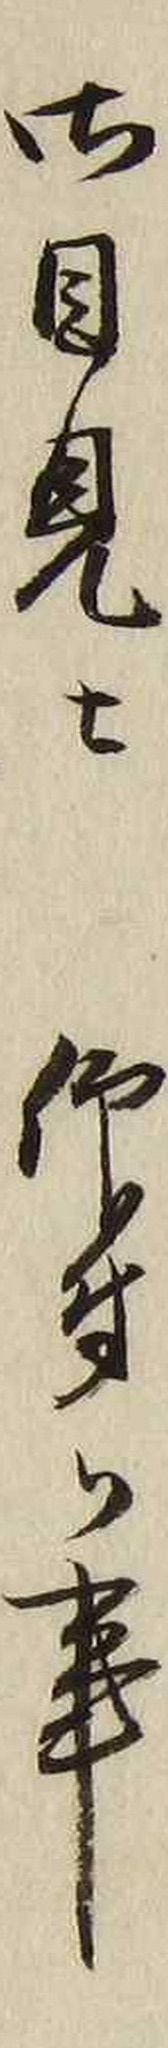御目見被仰付候事
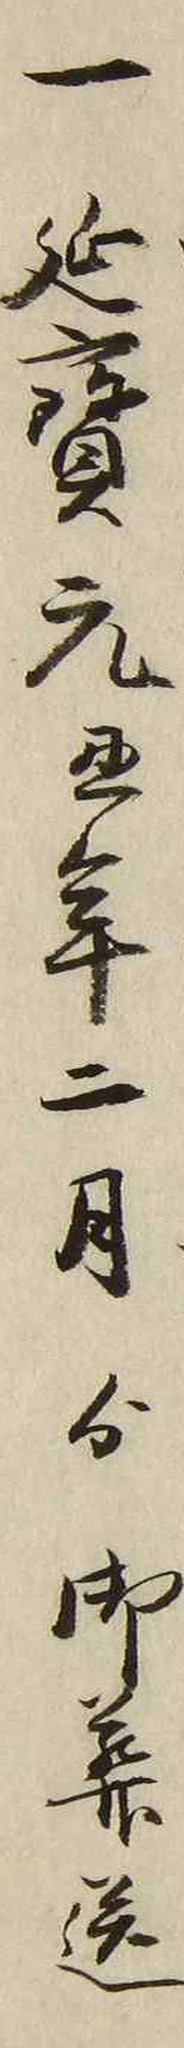一延宝元丑年二月ゟ御葬送

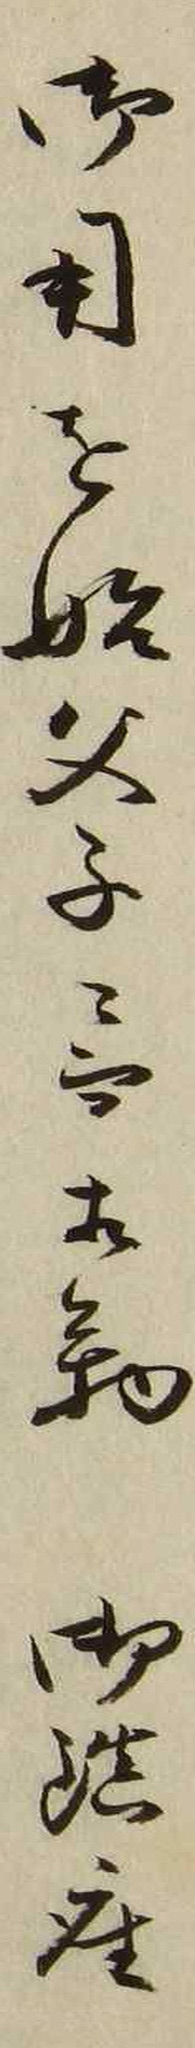御用を始父子ニ而相勤御鎮座
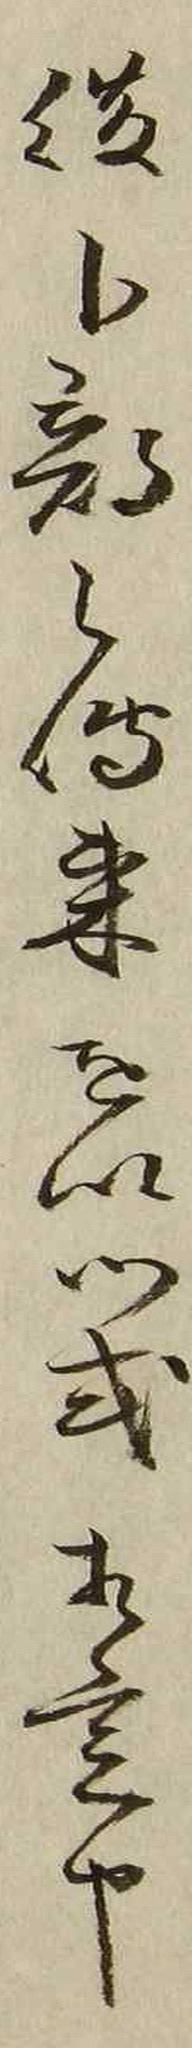後卜部之伝来を以御式相定申
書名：諸士系譜　巻之291　さ之部23
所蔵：会津若松市立会津図書館
